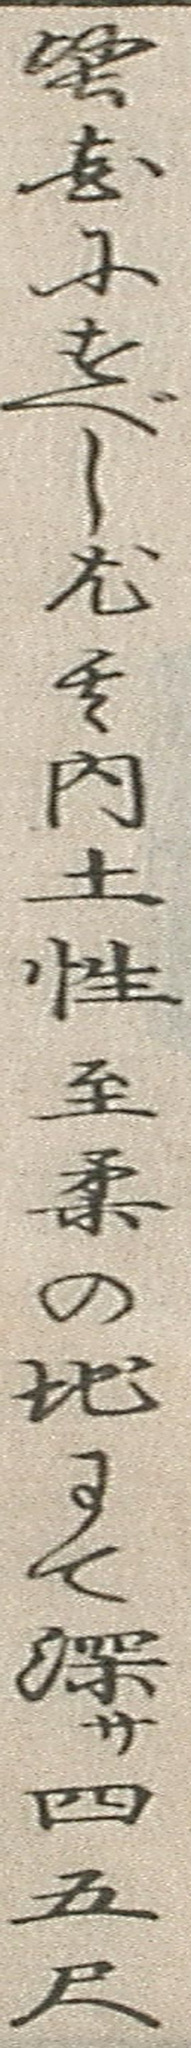堅固にすべし尤其内土性至柔の地にて深四五尺
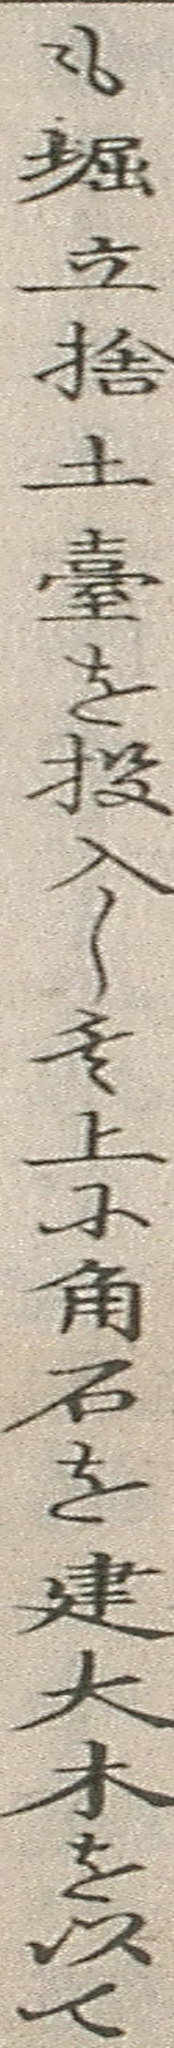も堀立捨土臺を投入し其上に角石を建大木を以て
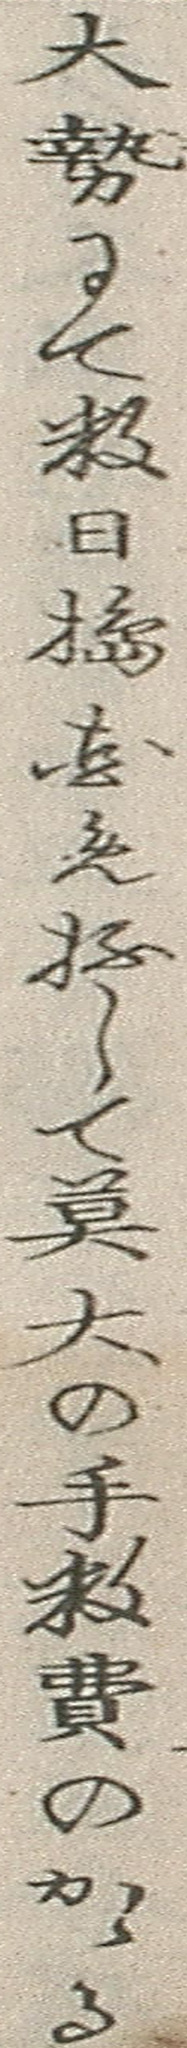大勢にて数日搗固め抔して莫大の手数費のかゝる
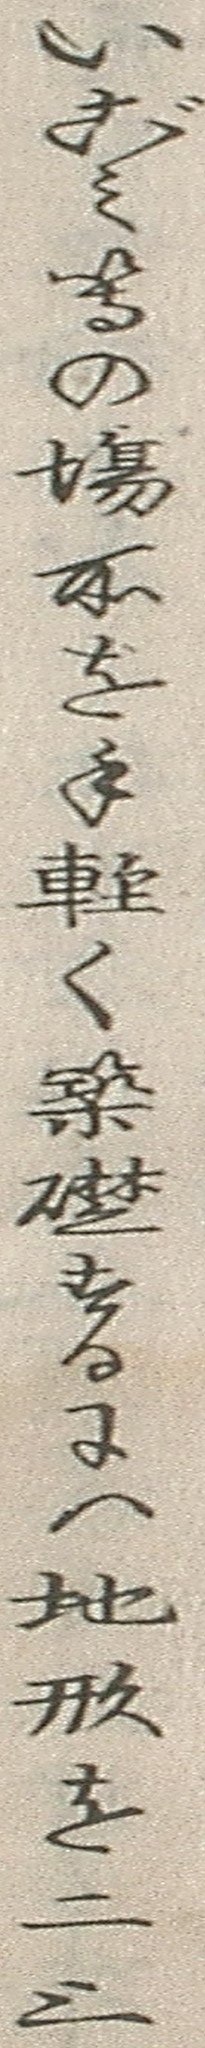いごみ等の場所を手軽く築礎するには地形を二三
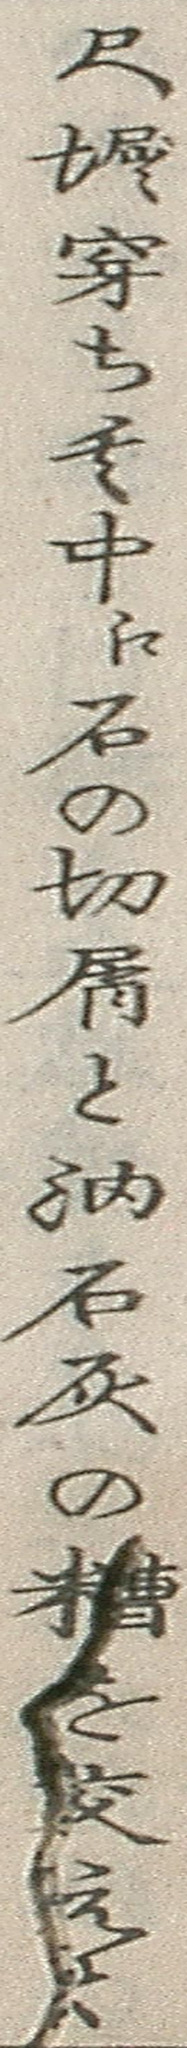尺堀穿ち其中江石の切屑と油石灰の糟を交え
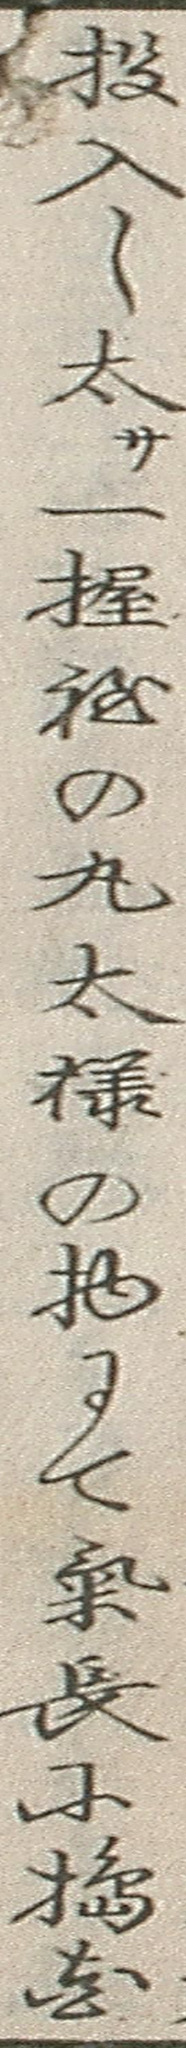投入し太一握程の丸太様の物にて気長に搗固
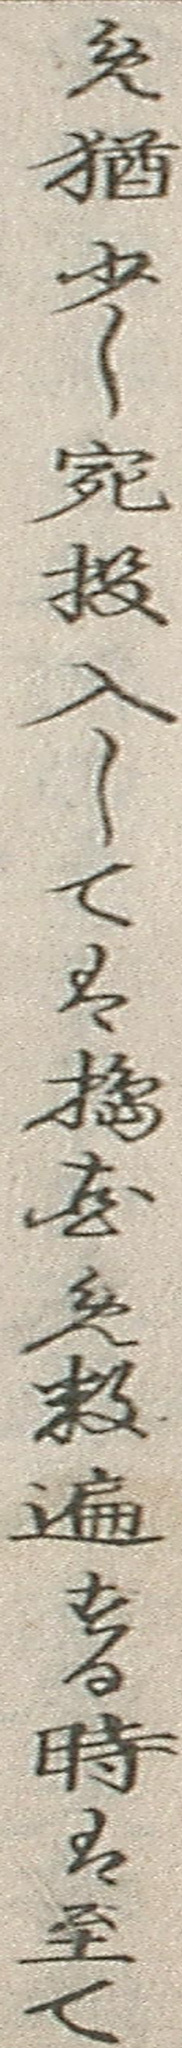め猶少し宛投入しては搗固め数遍する時は至て
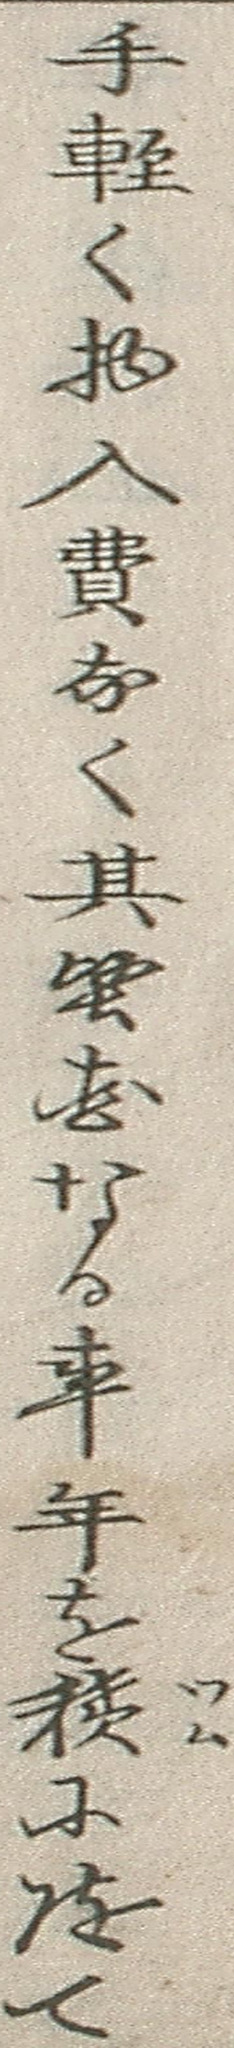手軽く物入費なく其堅固なる事年を積に随て
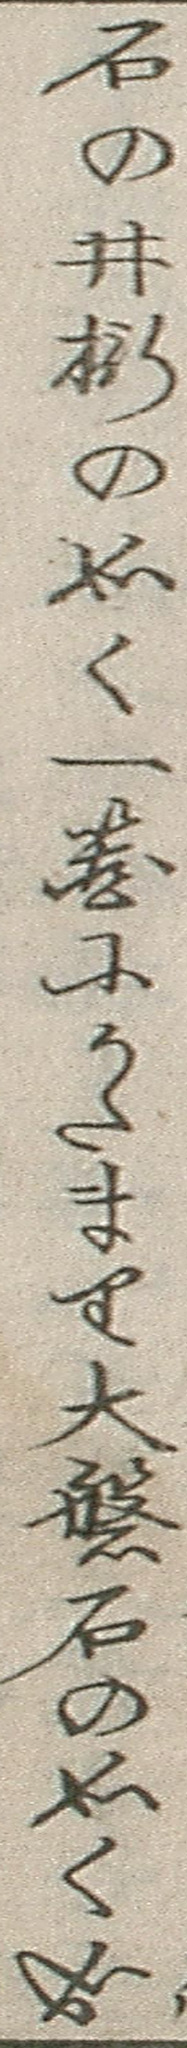石の井桁の如く一箇にかたまり大磐石の如く成

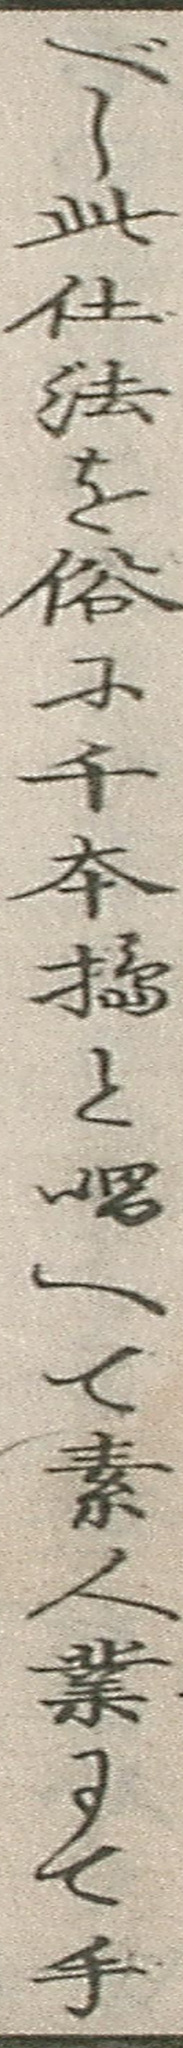べし此仕法を俗に千本搗と唱へて素人業にて手
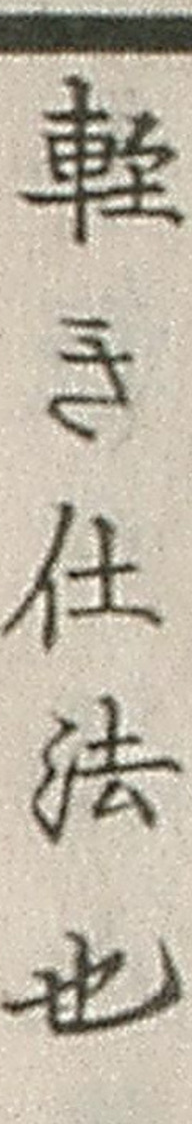軽き仕法也
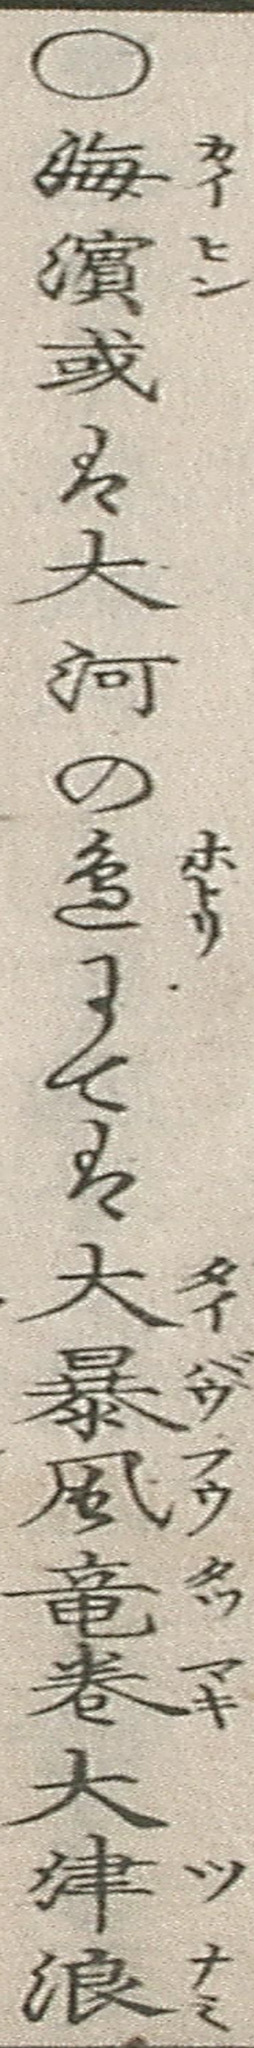〇海浜或は大河の辺にては大暴風竜巻大津浪
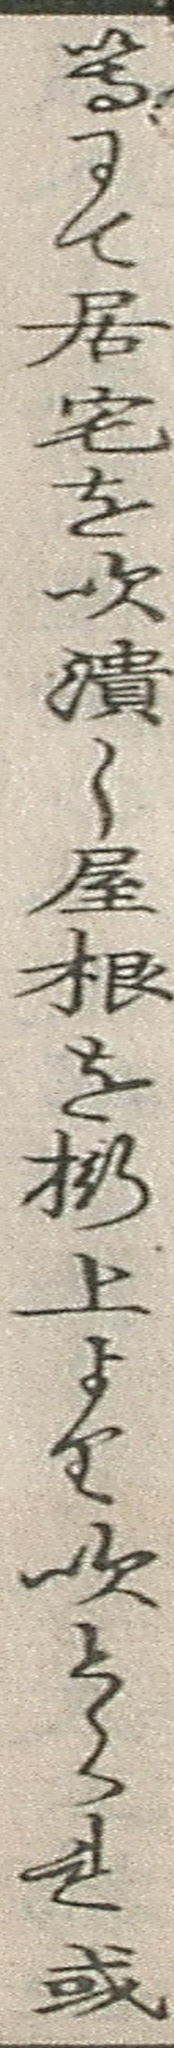等にて居宅を吹潰し屋根を桁上より吹とられ或
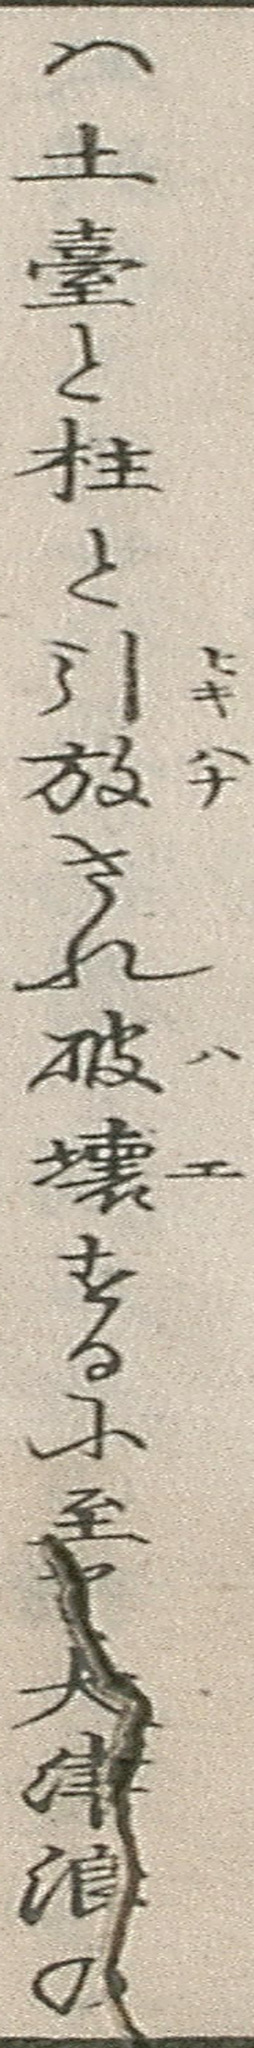は土臺と柱と引放され破壊するに至り大津浪の
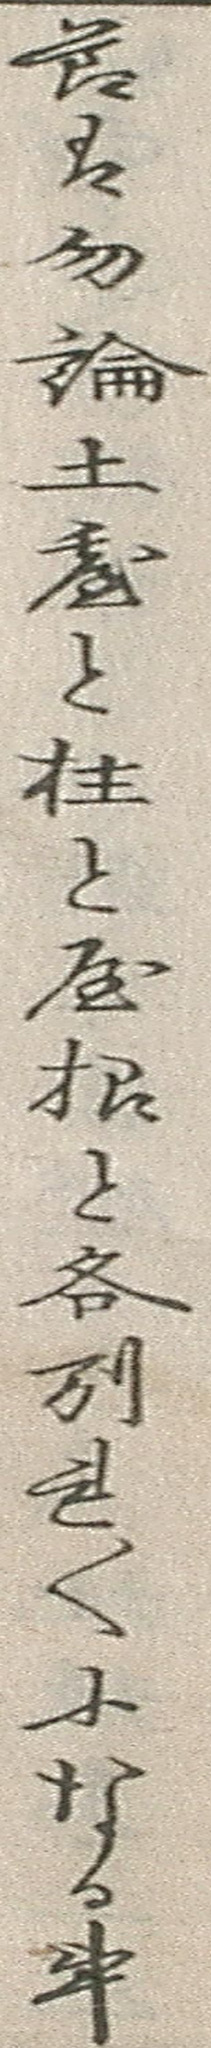節は勿論土臺と柱と屋根と各別れ〳〵になる事
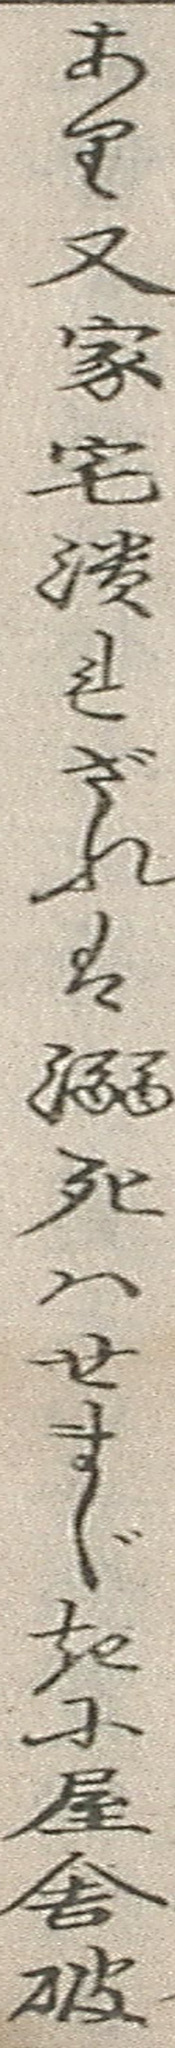あり又家宅潰れざれは溺死はせまじきに屋舎破破
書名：附録　地震劇風災害豫防法圖説（内題）
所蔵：東京大学地震研究所図書室 Earthquake Research Institute Library, The University of Tokyo, JAPAN
